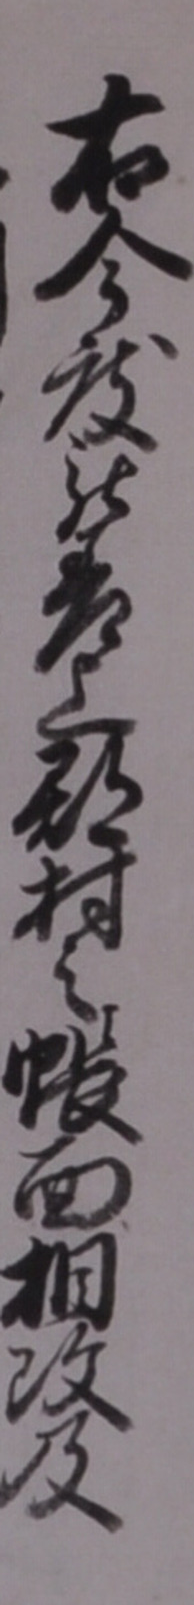右今度被差上郡村之帳面相改及
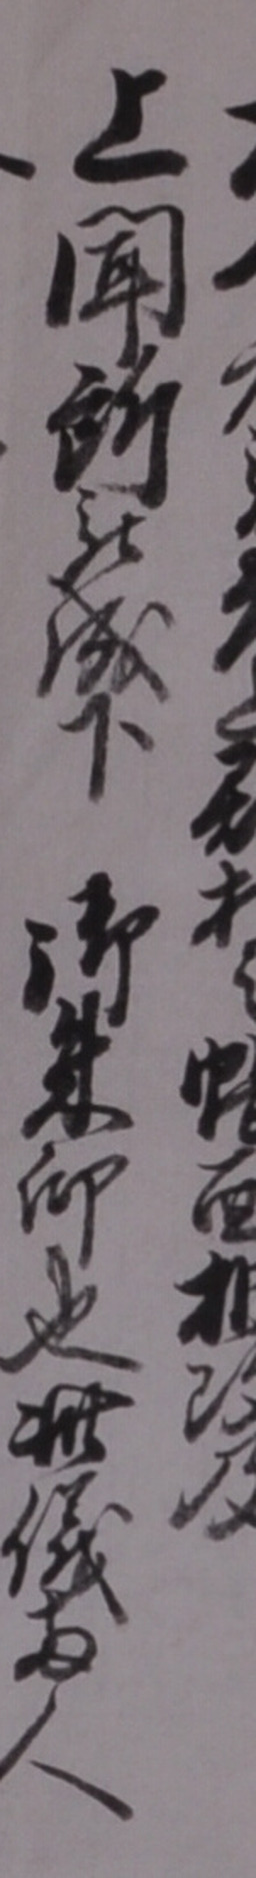上聞所被成下御朱印也此儀両人
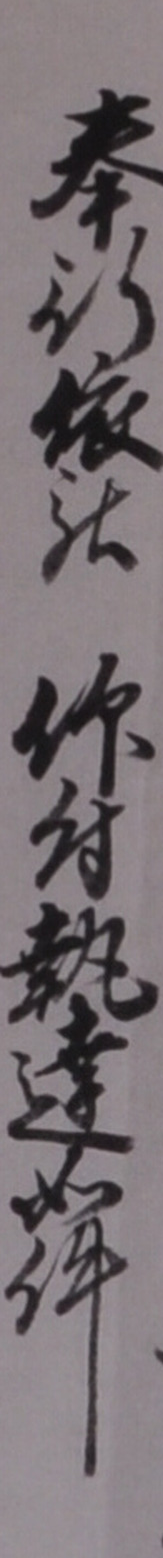奉行依被仰付執達如件
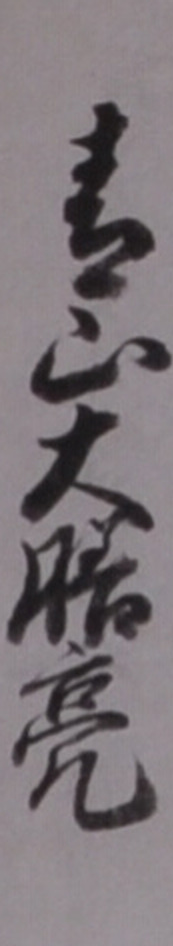青山大膳亮
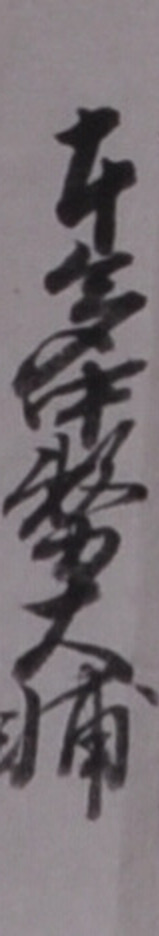本多中務大輔
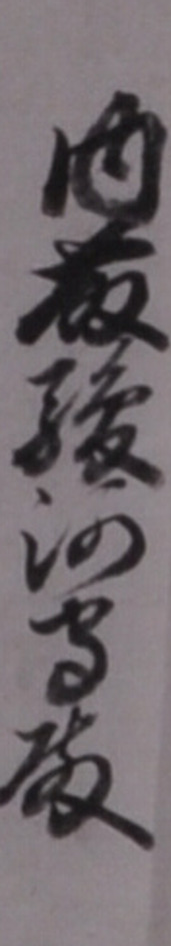内藤駿河守殿

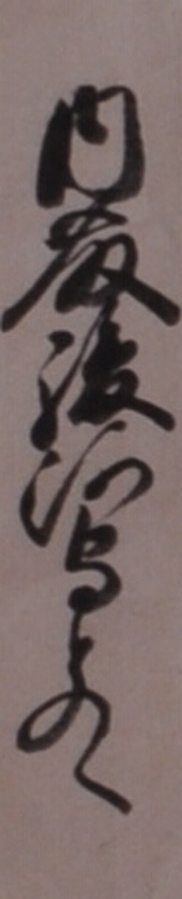内藤駿河守とのへ
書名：御朱印写・領地目録
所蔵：伊那市立高遠町図書館・合同会社AMANE
